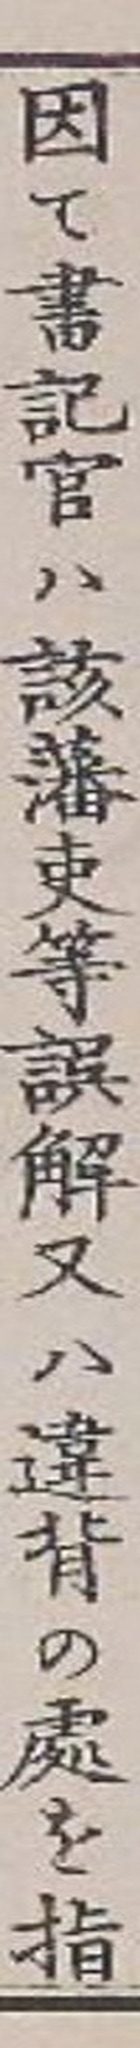因て書記官は該藩吏等誤解又は違背の処を指
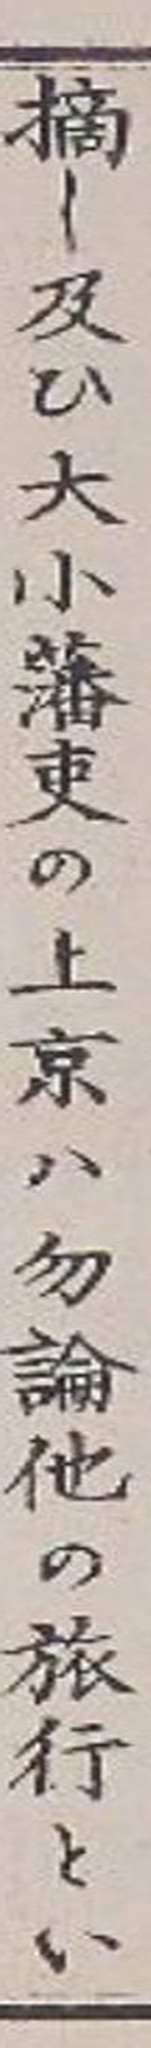摘し及ひ大小藩吏の上京は勿論他の旅行とい
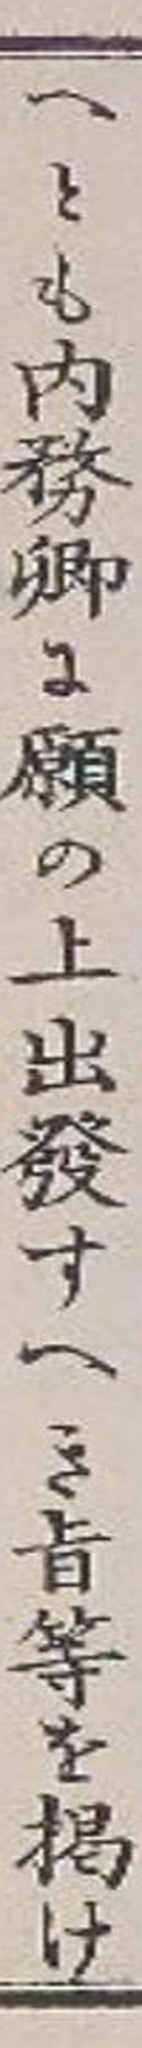へとも内務卿に願の上出発すへき旨等を掲け
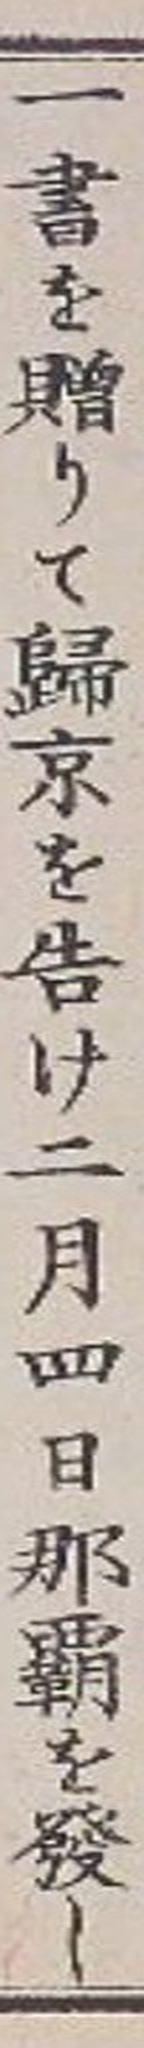一書を贈りて帰京を告け二月四日那覇を発し
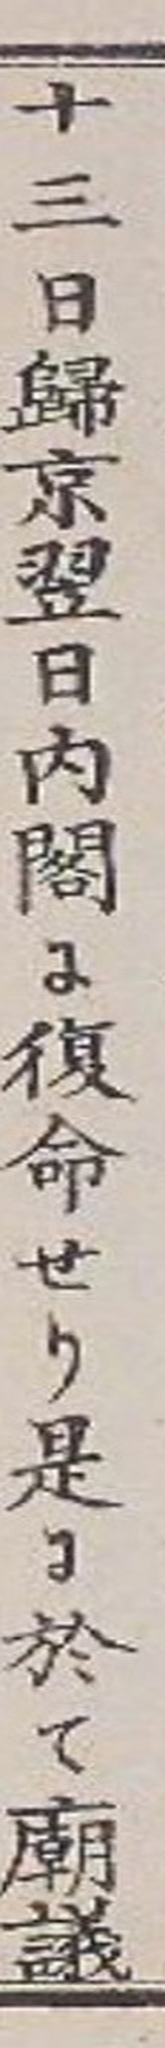十三日帰京翌日内閣に復命せり是に於て廟議
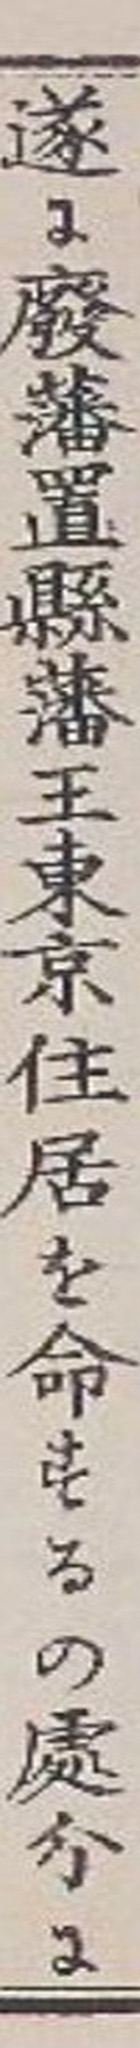遂に廃藩置県藩王東京住居を命するの処分に
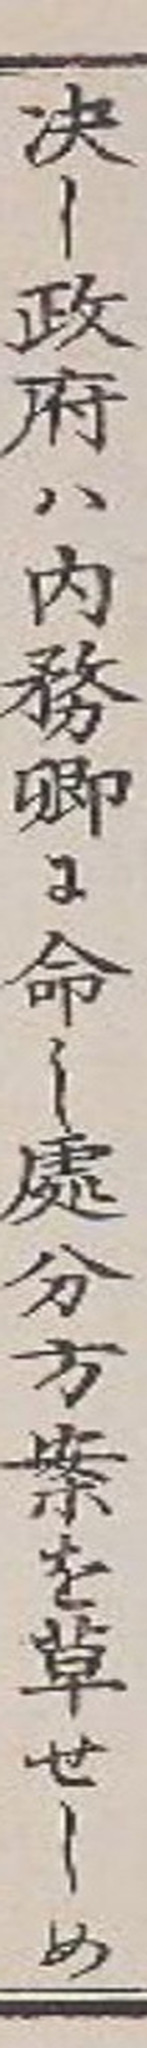決し政府は内務卿に命し処分方案を草せしめ
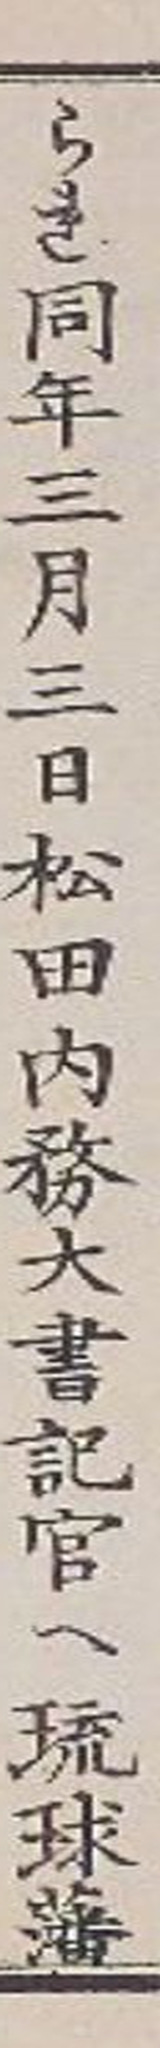られ同年三月三日松田内務大書記官へ琉球藩
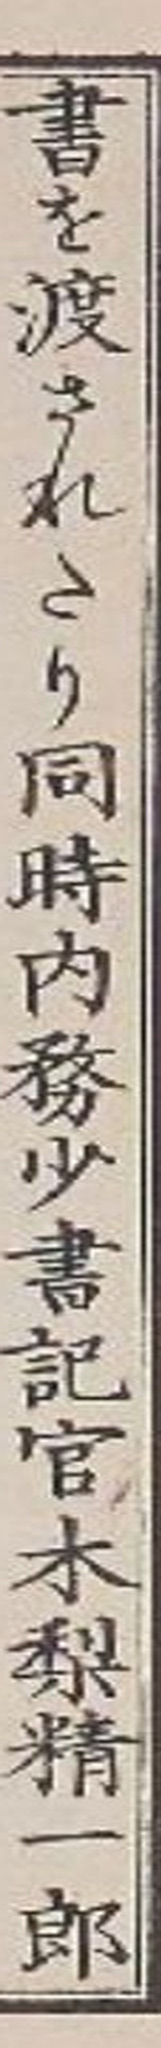書を渡されたり同時内務少書記官木梨精一郎
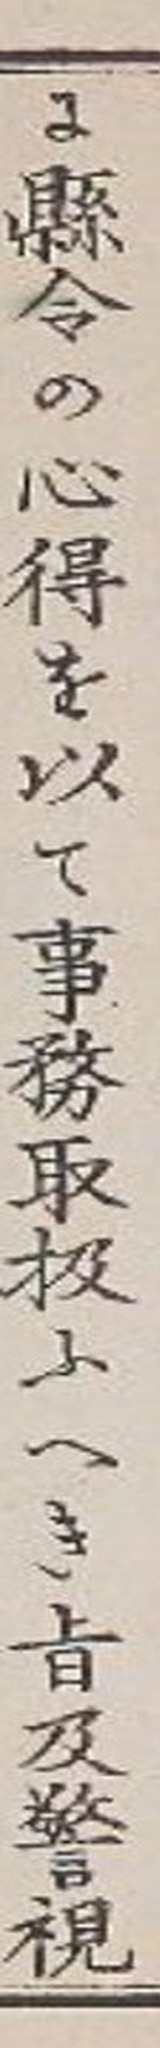に県令の心得を以て事務取扱ふへき旨及警視
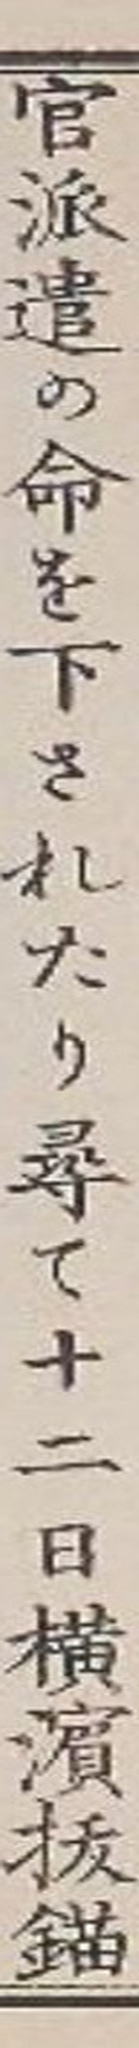官派遣の命を下されたり尋て十二日横浜抜錨
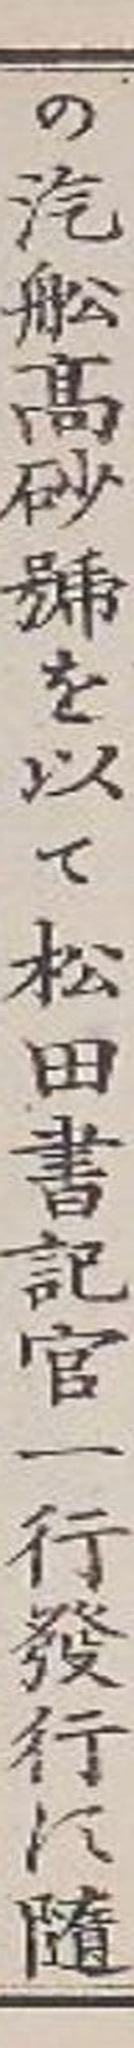の汽船高砂号を以て松田書記官一行発行に随
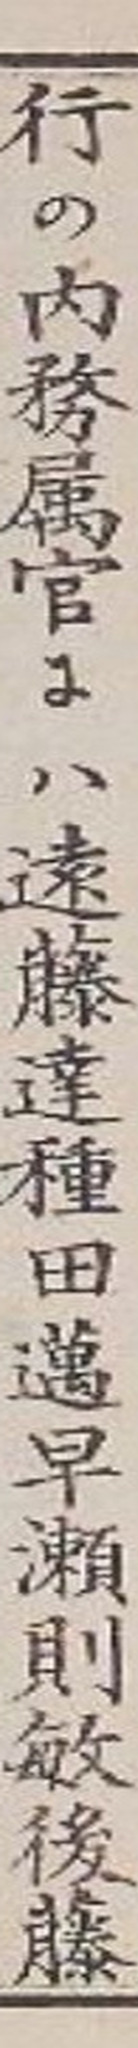行の内務属官には遠藤達種田邁早瀬則敏後藤
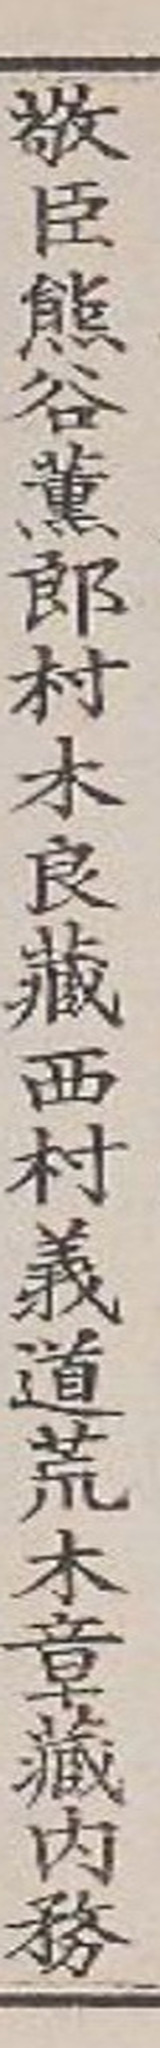敬臣熊谷薫郎村木良蔵西村義道荒木章蔵内務
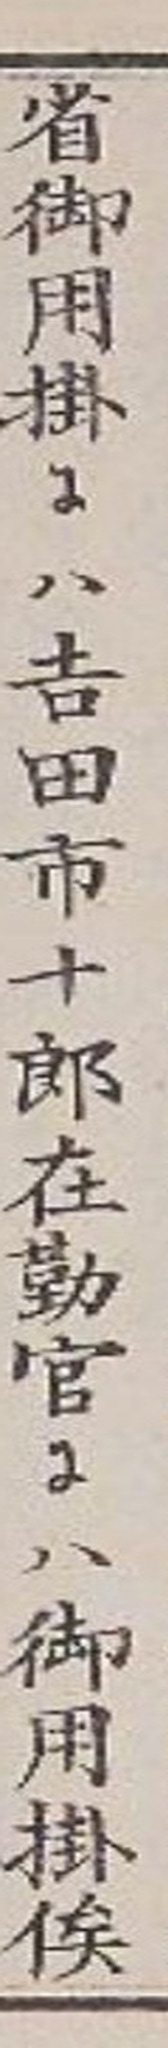省御用係には吉田市十郎在勤官には御用係俟
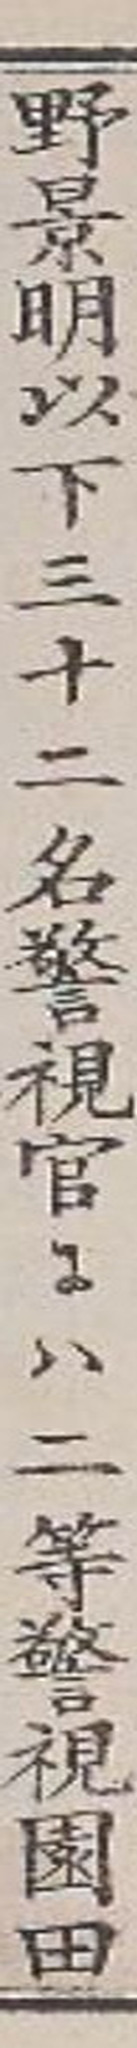野景明以下三十二名警視官には二等警視園田
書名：南島紀事 下
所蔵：University of the Ryukyus Library
